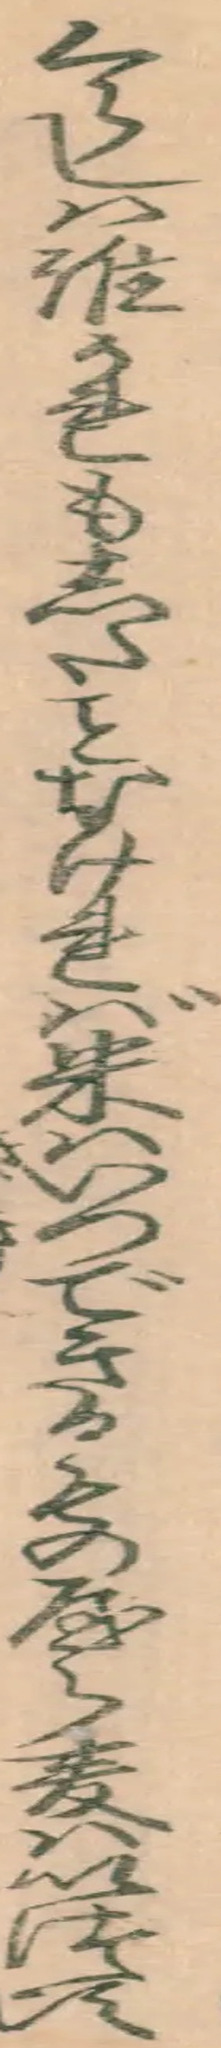くらしは誰かれもしたことなければ米はいつできるものやら麦はいつ頃
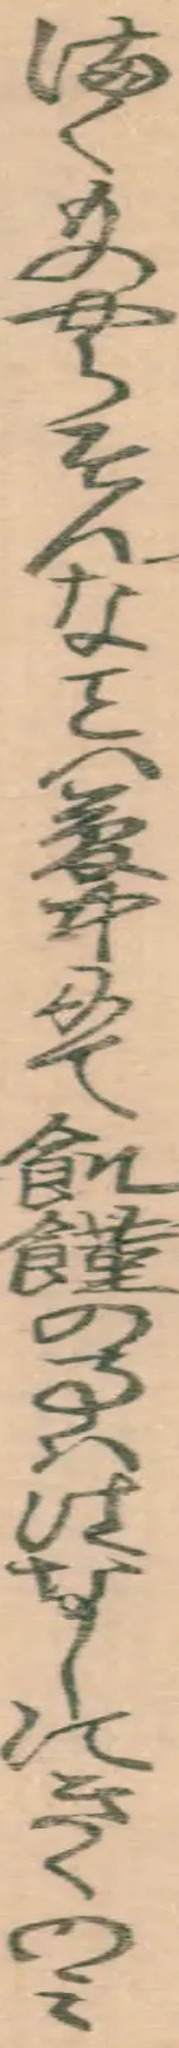まくものやらそんなことは夢中にて飢饉の事ははなしにきくのみ
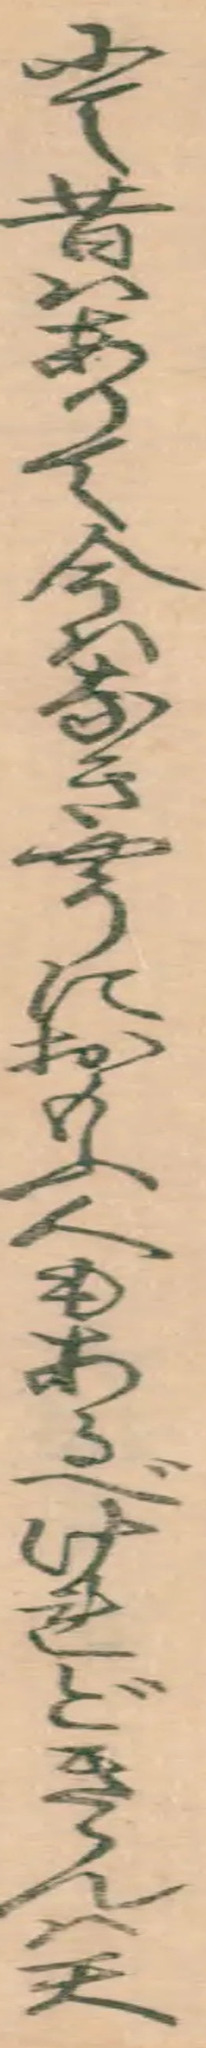にて昔はありて今はなきやうにおもふ人もあるべけれどきゝんは天
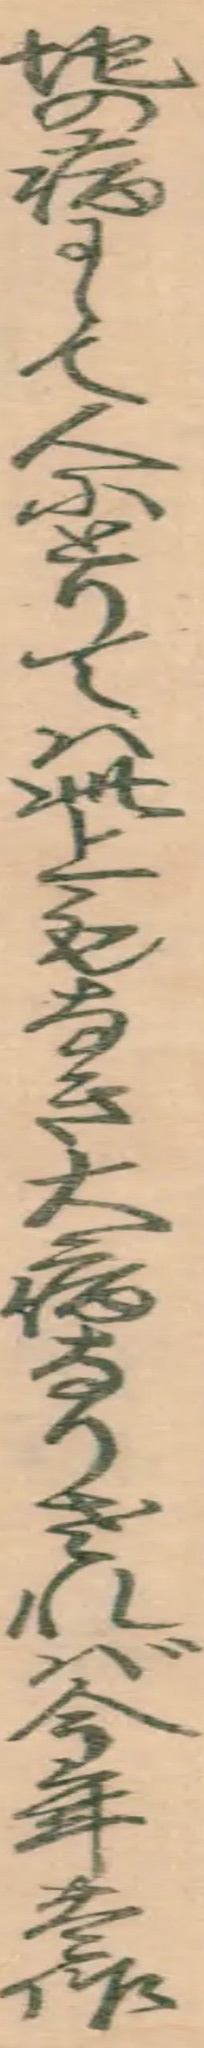地の病にして人にとりては此上もなき大病なりされば今年豊作
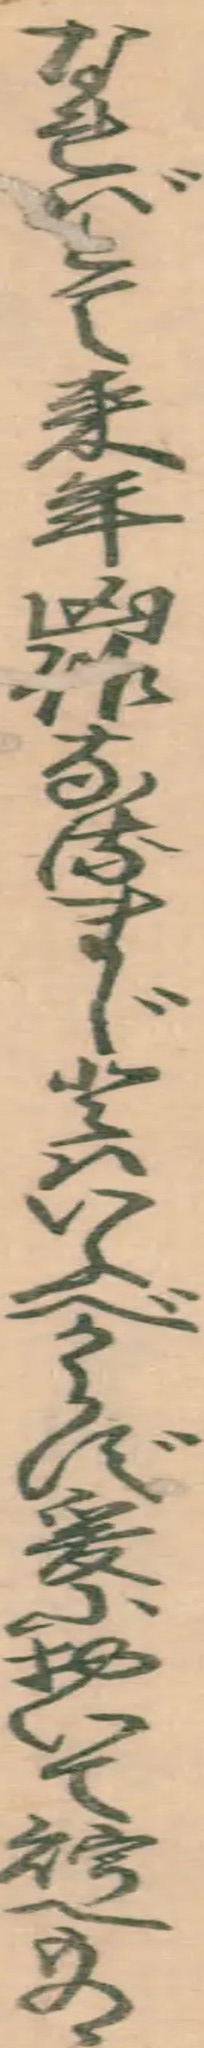なればとて来年凶作なるまじとはいふべからず爰において貯へものゝ
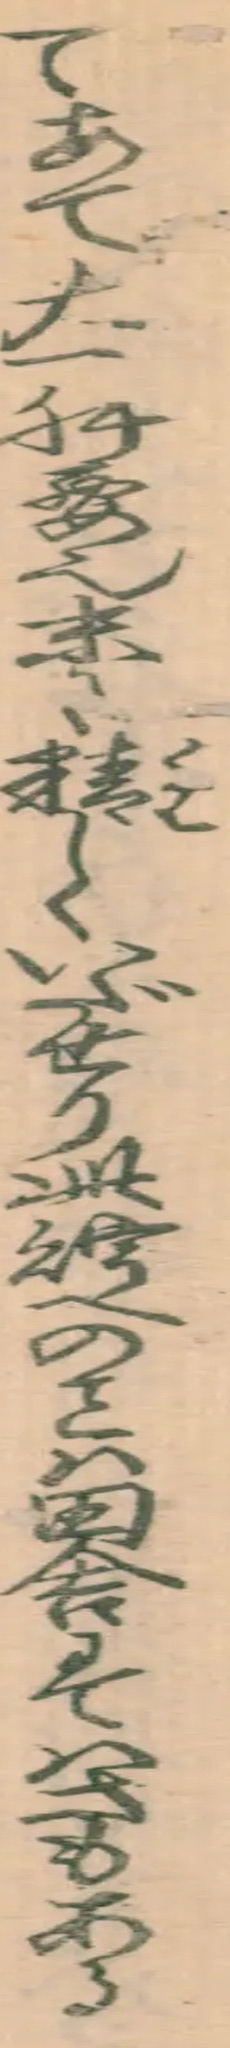てあて大一肝要也末に精しくいだせり此貯へのことは田舎にてはさもある
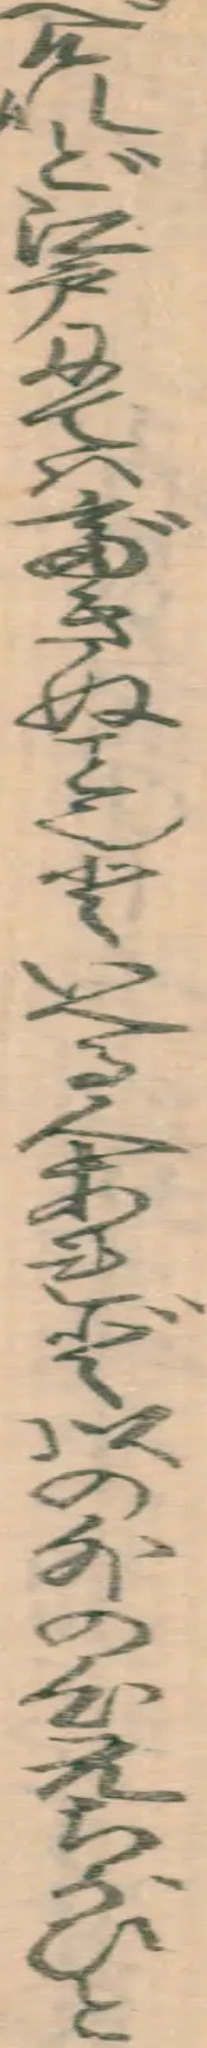べけれど江戸にてはできぬこと也といへる人あれど以の外の心えちがひと
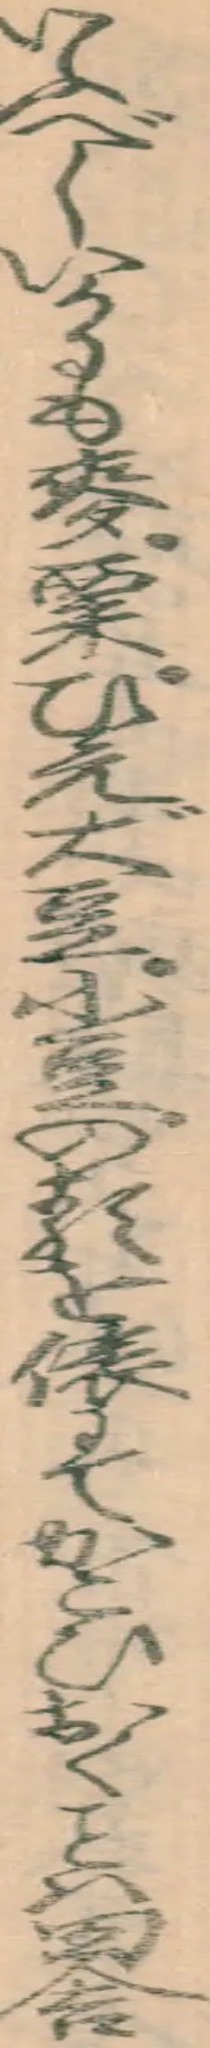いふべしいかにも麦．粟．ひえ゛大豆．小豆．の類を俵にてかこひおくことは田舎
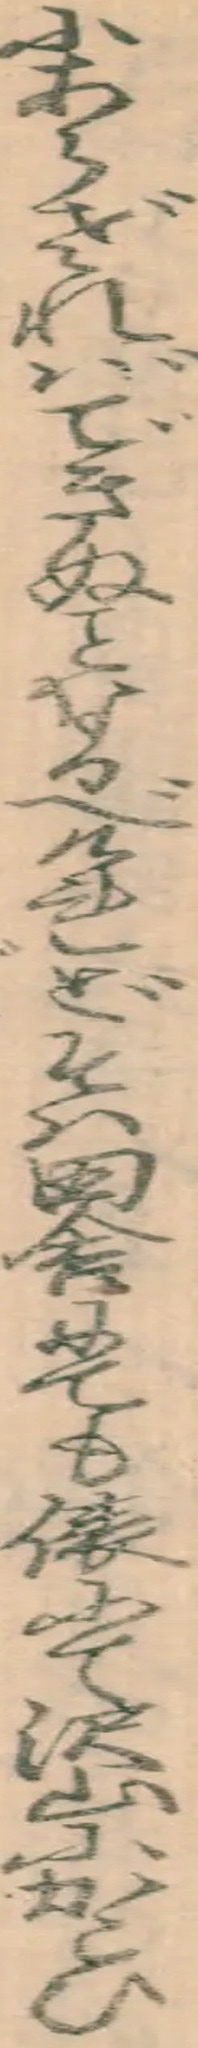にあらざればできぬことなるべけれどそは田舎にても俵にて沢山にかこひ
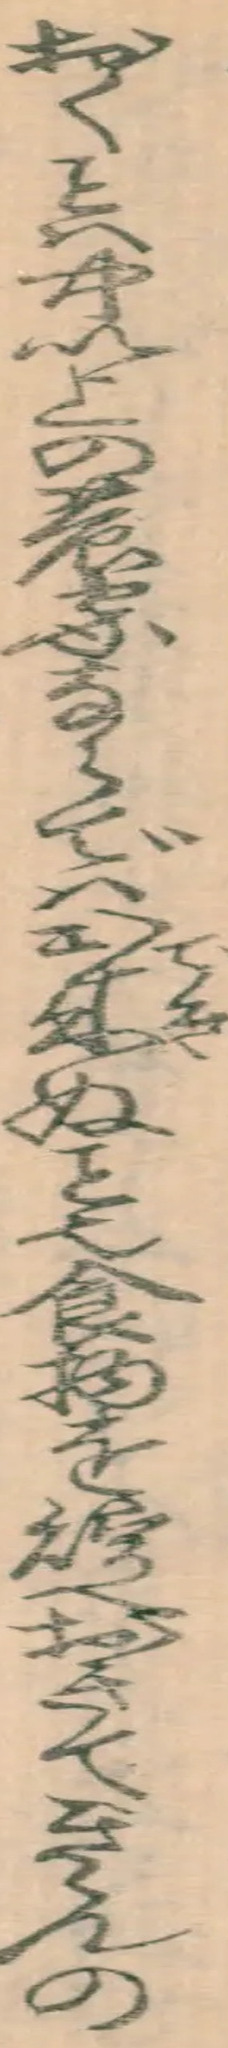おくことは中以上の農家ならでは出来ぬこと也食物を貯へおきてきゝんの
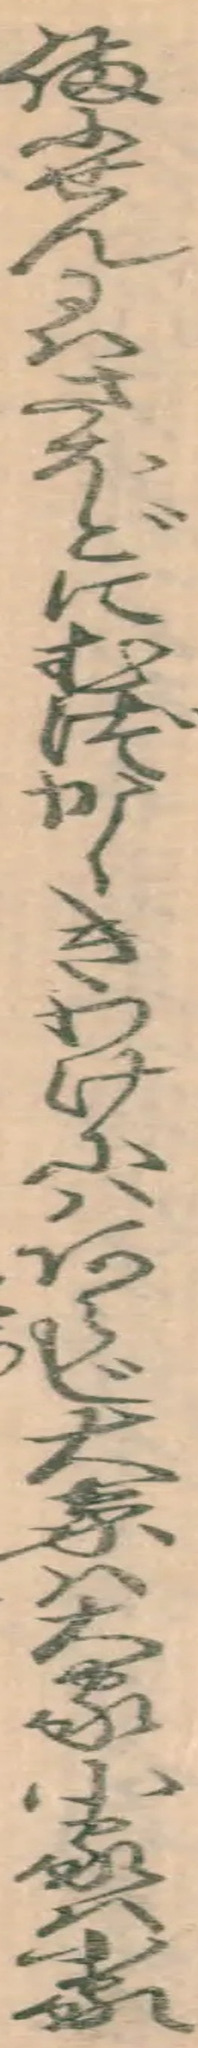備にせんにはさほどにむづかしきわけにはあらじ大家は大家小家は小家
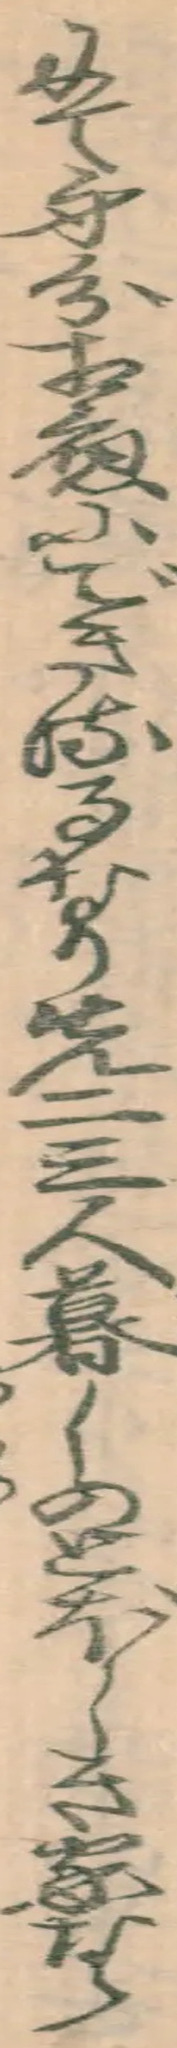にて身分相応にできる事なり先二三人暮しのとぼしき家なら
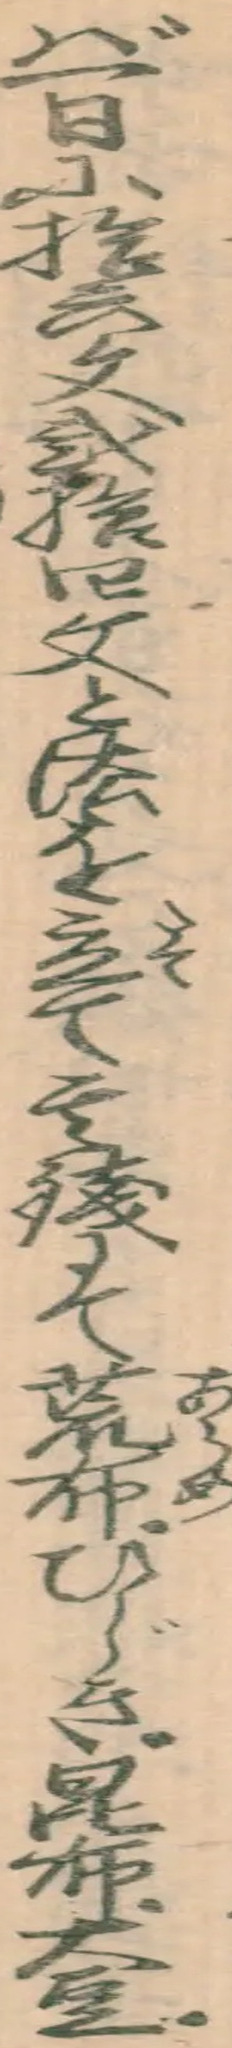ば一日に拾六文弐拾四文と法を立て其銭にて荒布．ひじき．昆布．大豆．
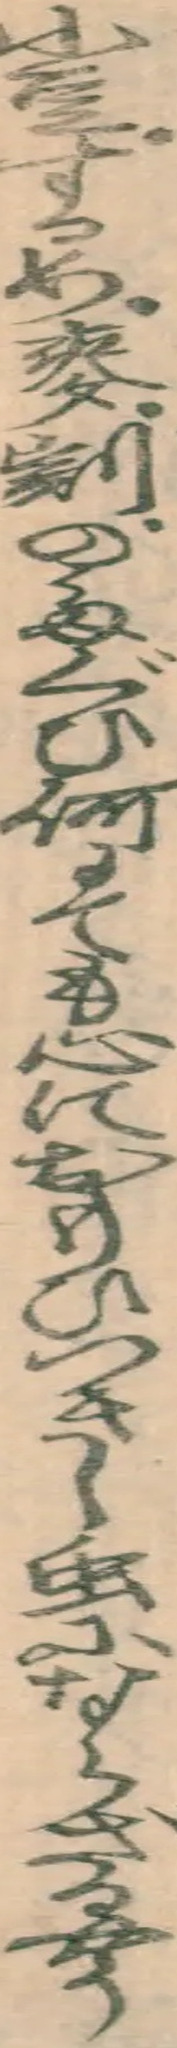小豆．するめ．麦．割．のたぐひ何にても心におもひつきし虫にならざるやう
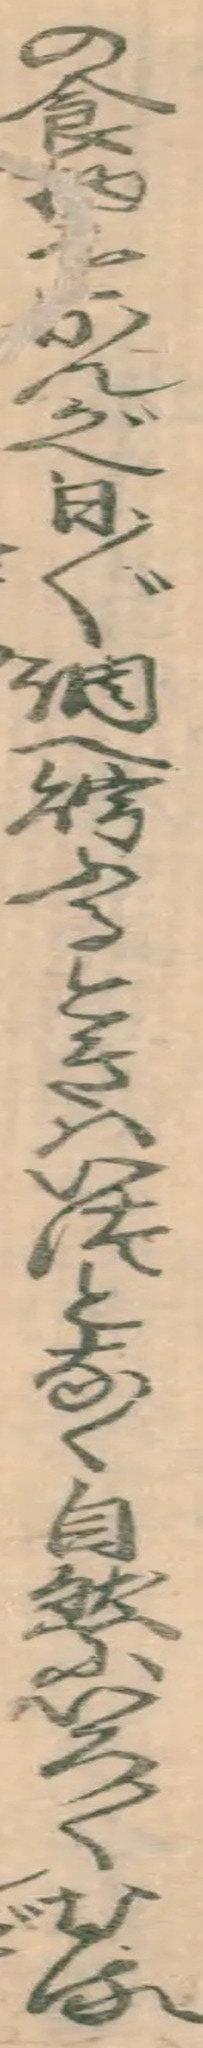の食物をかんがへ日〴〵調へ貯ふるときはいつとなく自然にいろ〳〵なる
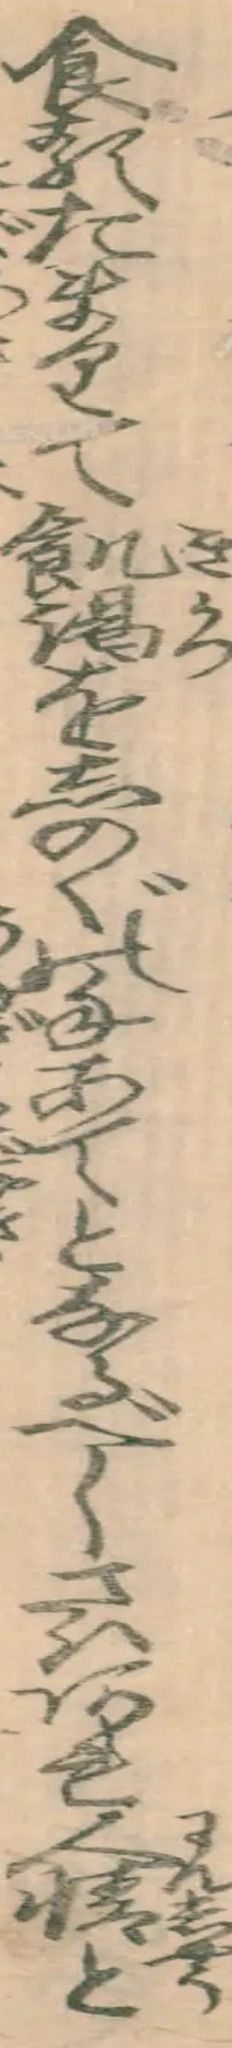食類たまりて飢渇をしのぐの手あてとなるべしさはあれ人情と
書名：日ごとの心得
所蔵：国立国会図書館 National Diet Library, JAPAN
